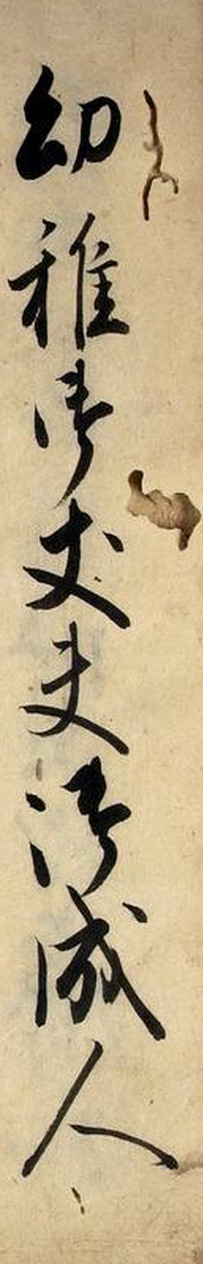幼稚御丈夫御成人
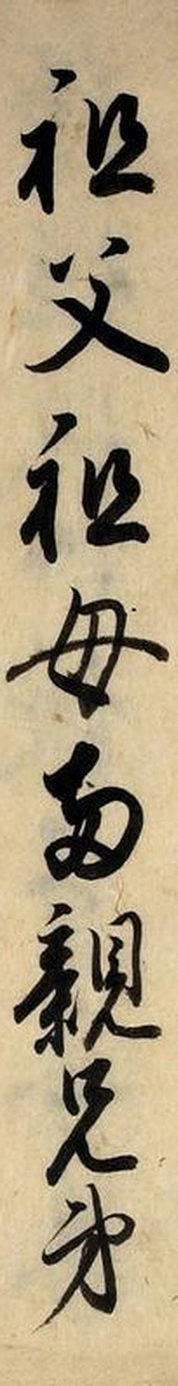祖父祖母両親兄弟
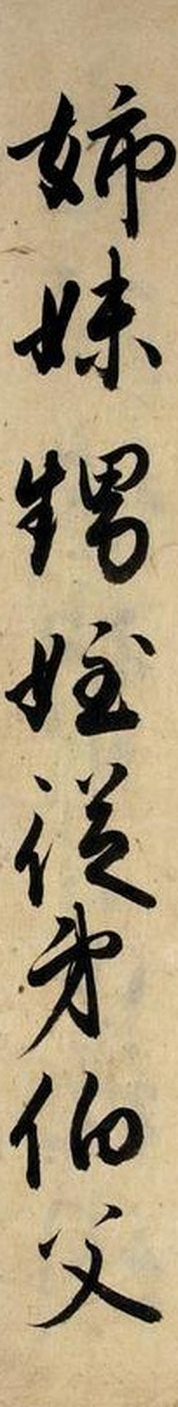姉妹甥姪従弟伯父
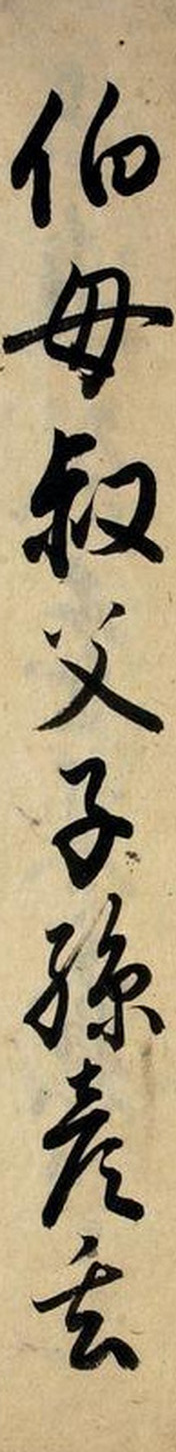伯母叔父子孫彦玄
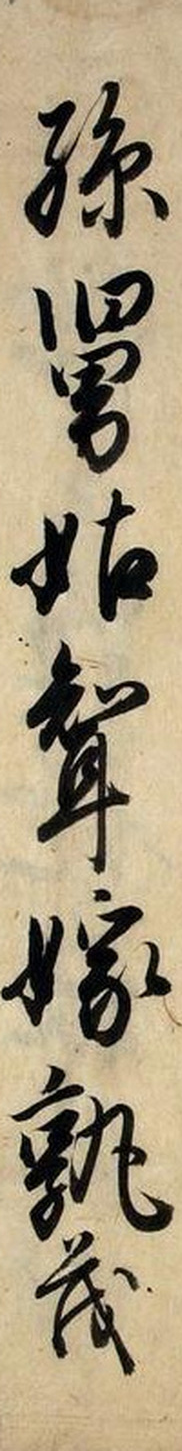孫舅姑聟嫁孰茂
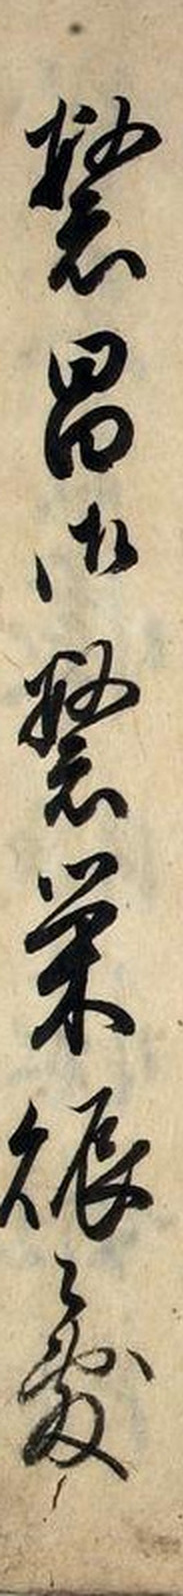繁昌御繁栄賑々敷

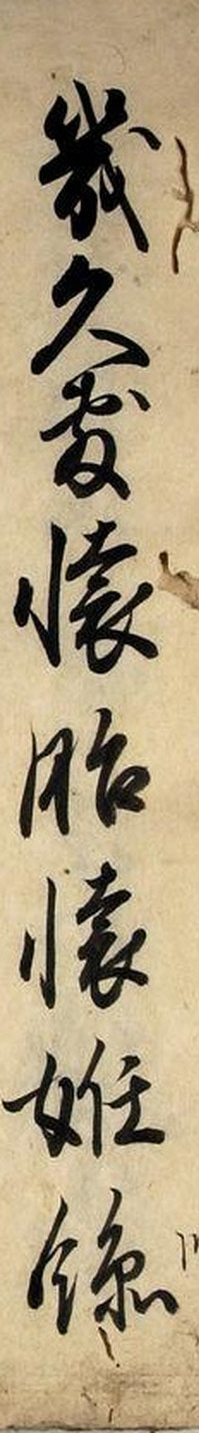幾久敷懐胎懐妊臨
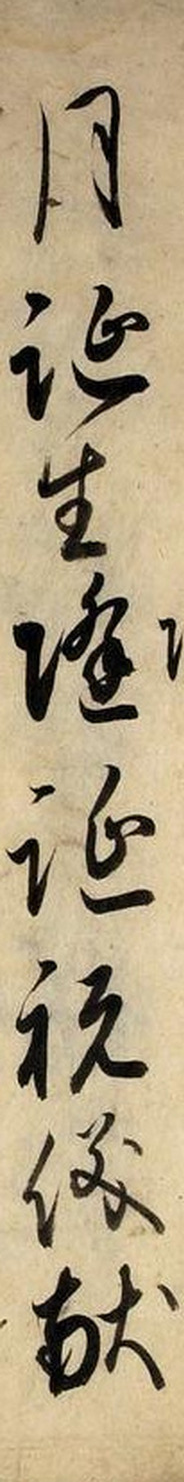月誕生降誕祝儀献
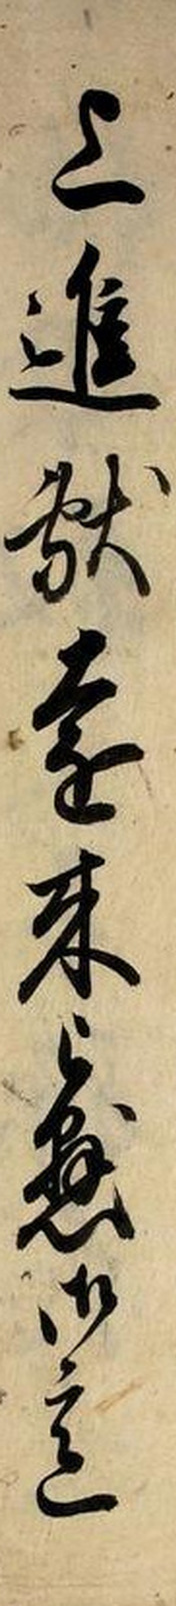上進献遠来被懸御意
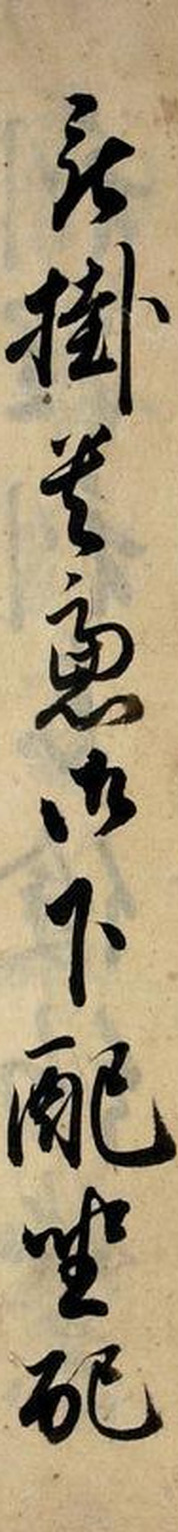被掛貴慮御下配坐配
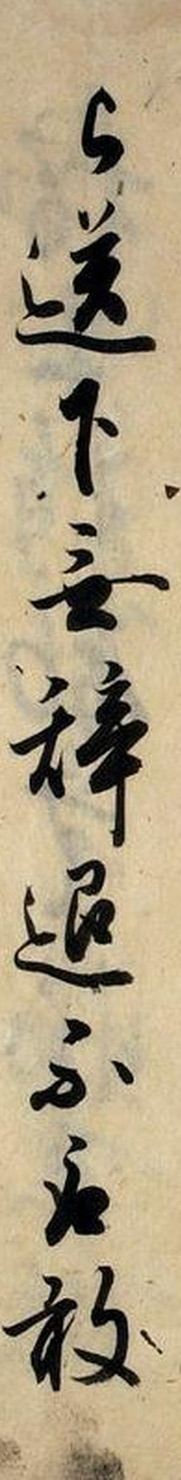被送下無辞退不取敢
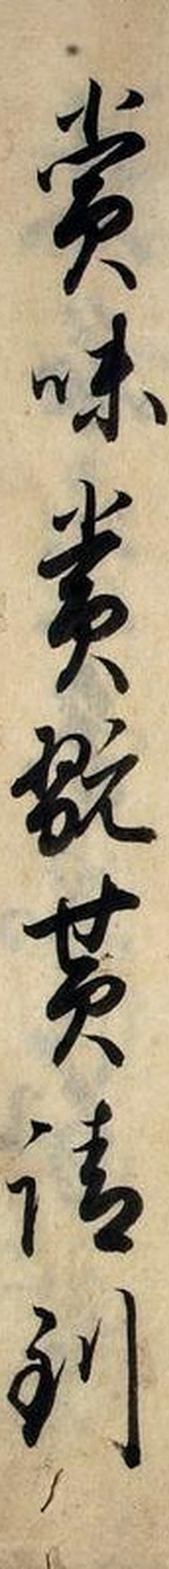賞味賞翫貰請到

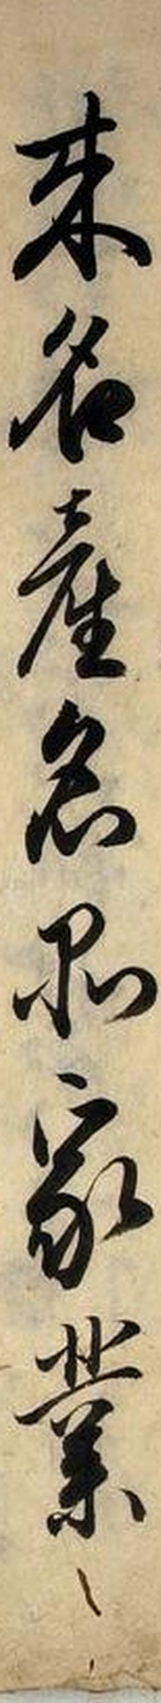来名産名品家業
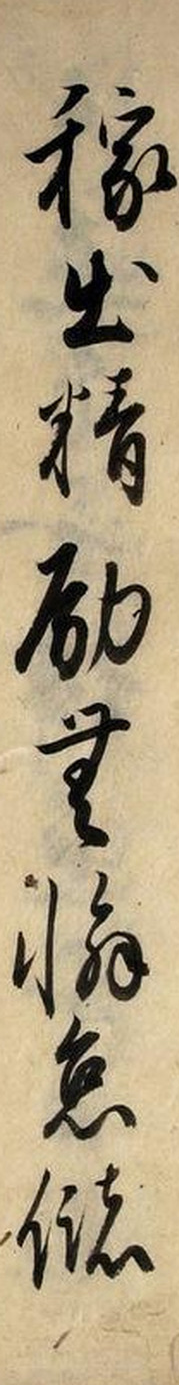稼出精励無懈怠儲
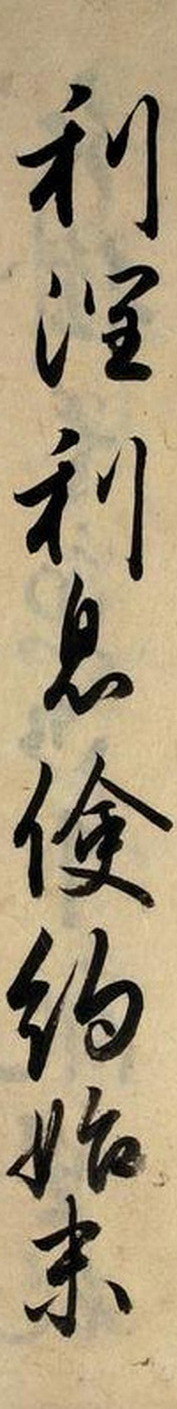利潤利息倹約始末
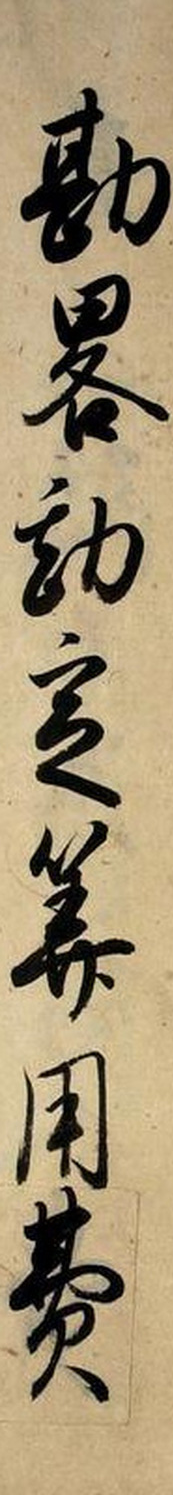勘略勘定算用費
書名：消息千字文（往来物、手習手本）
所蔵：福井県文書館 Fukui Prefectural Archives
